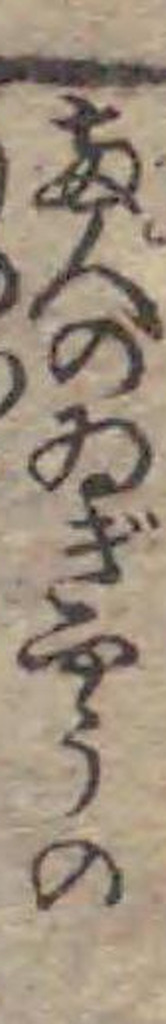両人のゐぎやうの
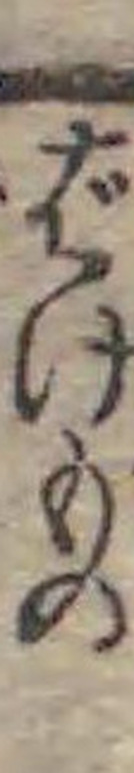ばけもの
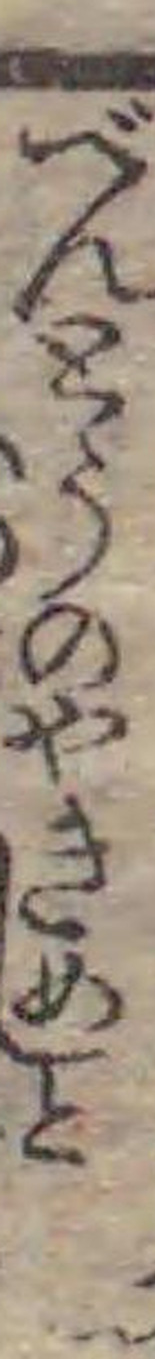べんとうのやきめしと
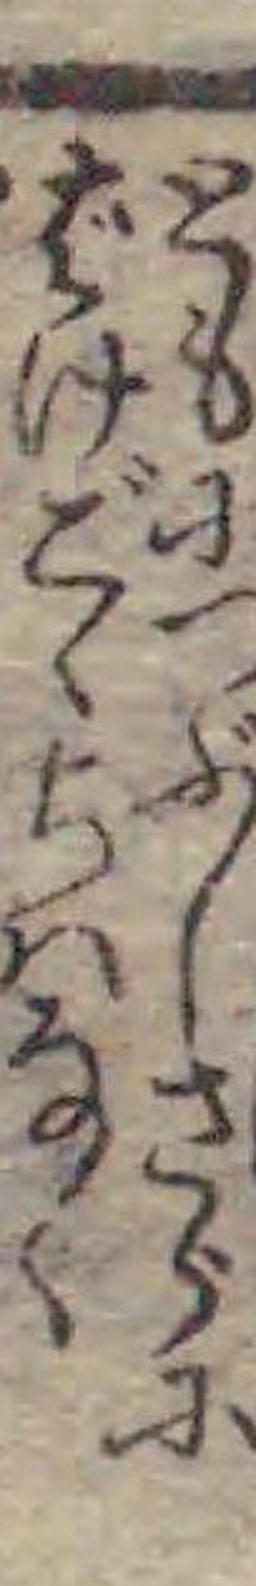ばけごゝちはなく
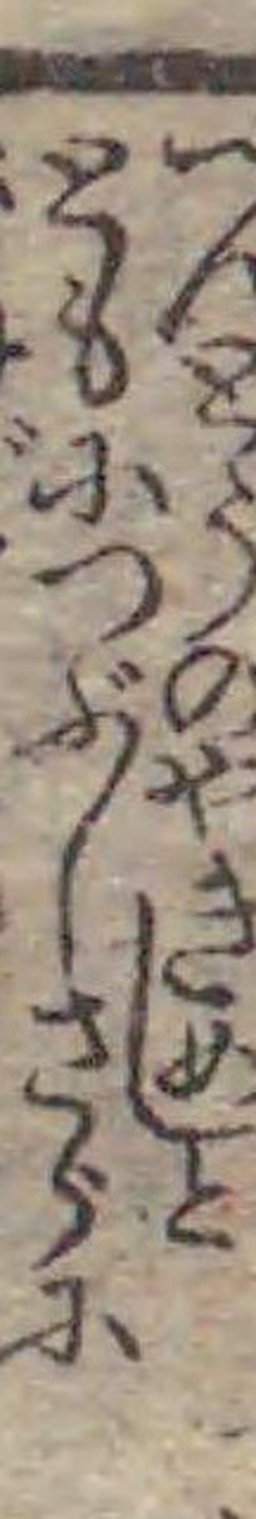ともにつぶしさらに
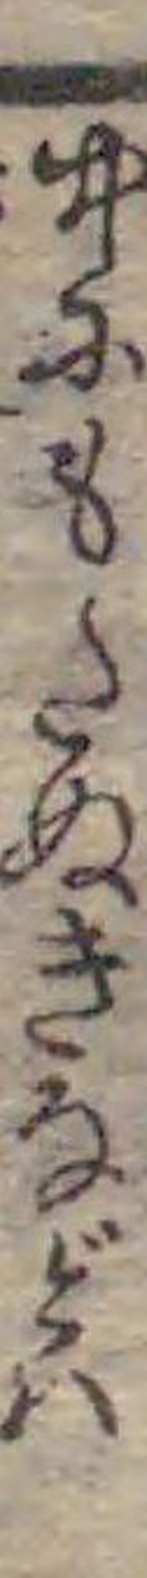中にもたぬきなどは
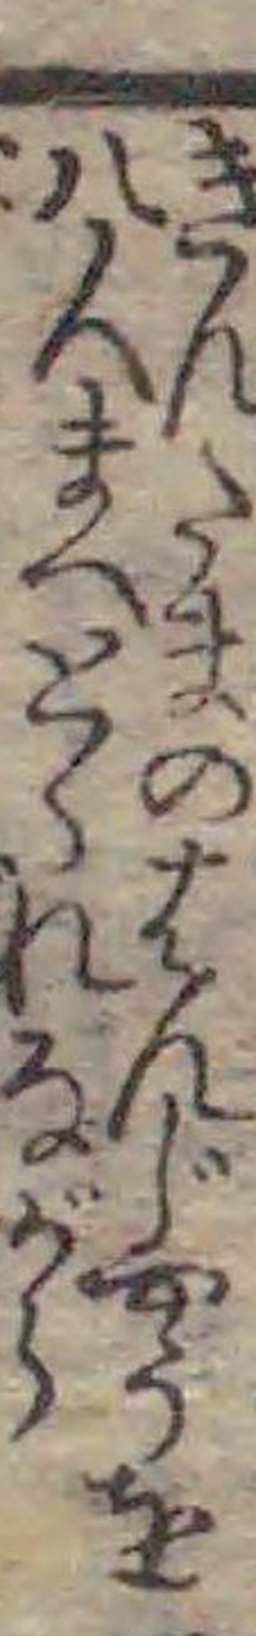八人まへとられながら
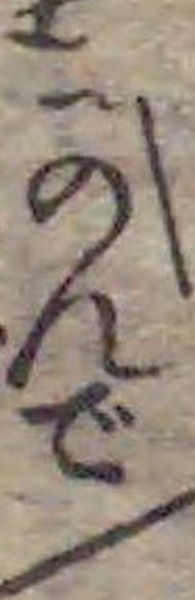〽のんで
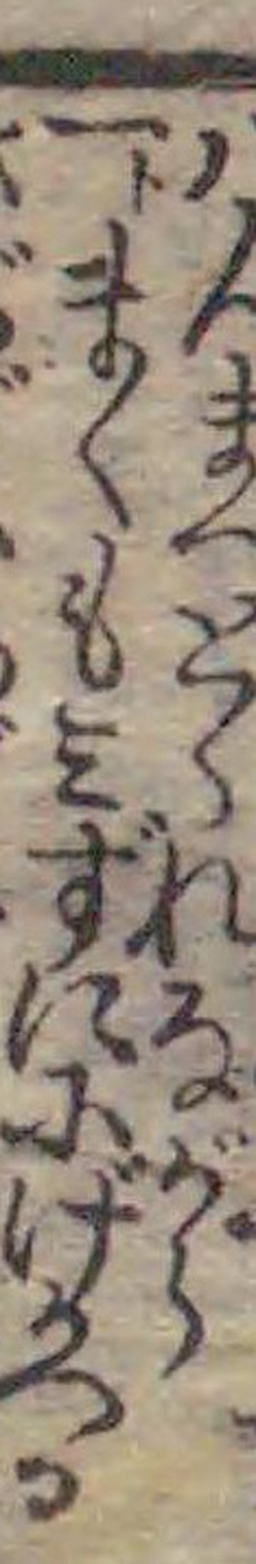一トまくもみずににげかへる
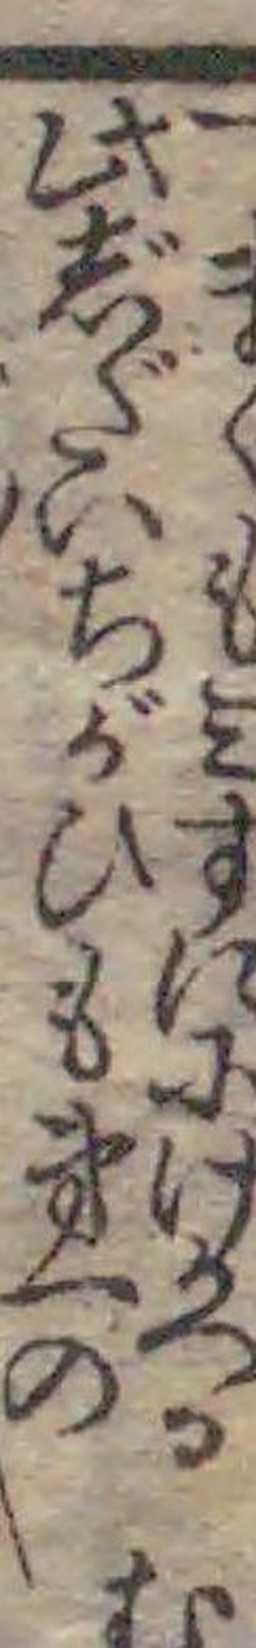此じだいちがひも第一の
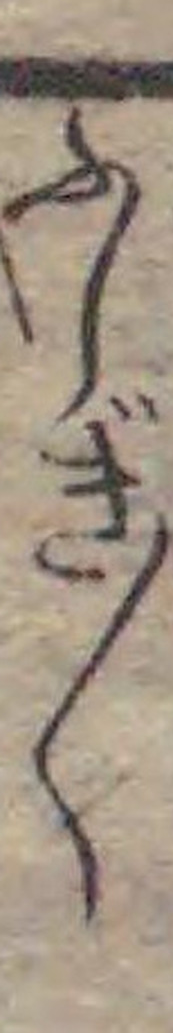ふしぎ〳〵
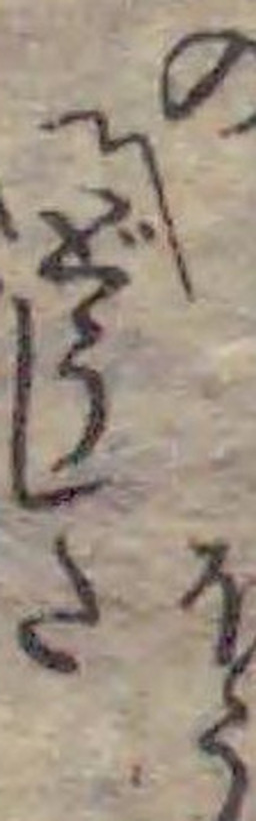〽どうした
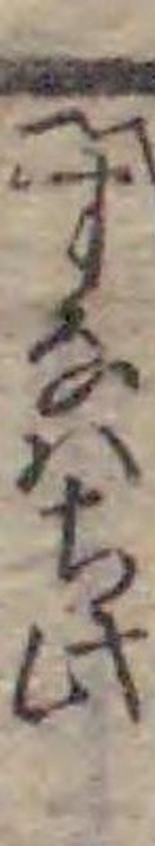〽すなはち此
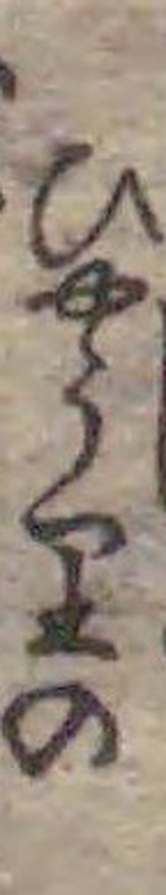ひやうりの
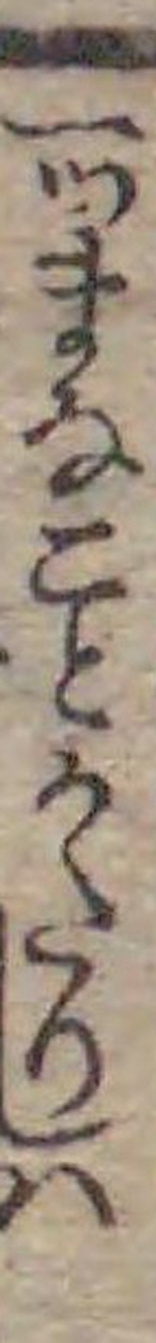一ツまなことかたりしは
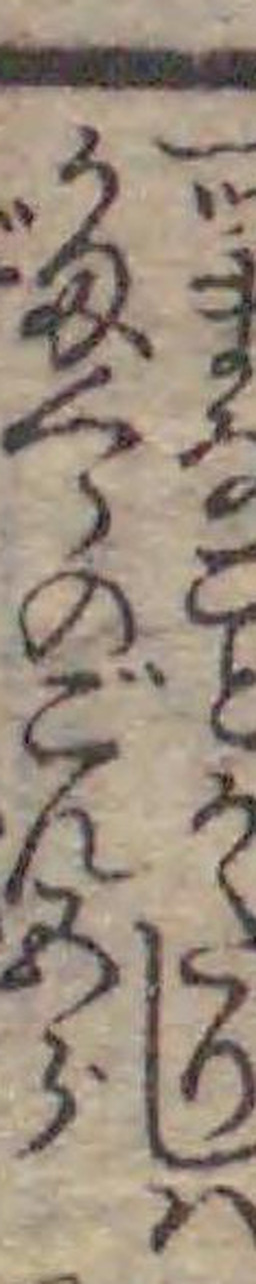かまくらのごん五郎
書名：怪物つれつれ草 : 2巻
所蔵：国立国会図書館 National Diet Library, JAPAN
